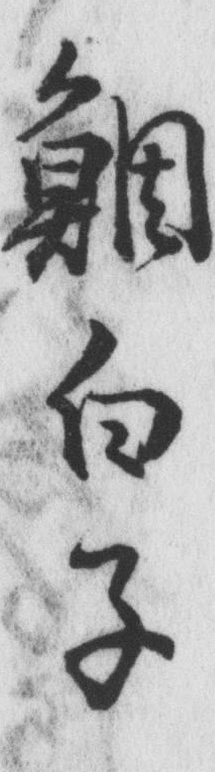鯛白子
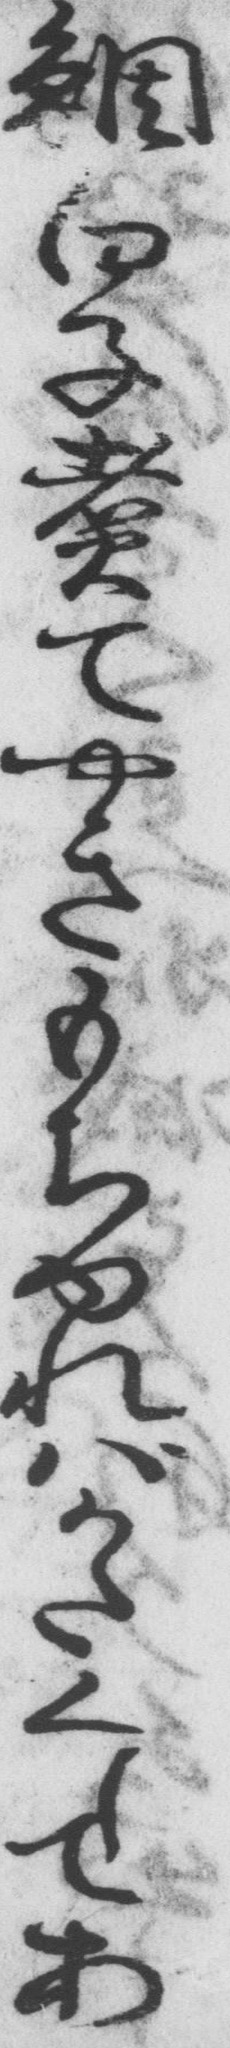鯛白子煮てやきもちゆればかたくしてあ
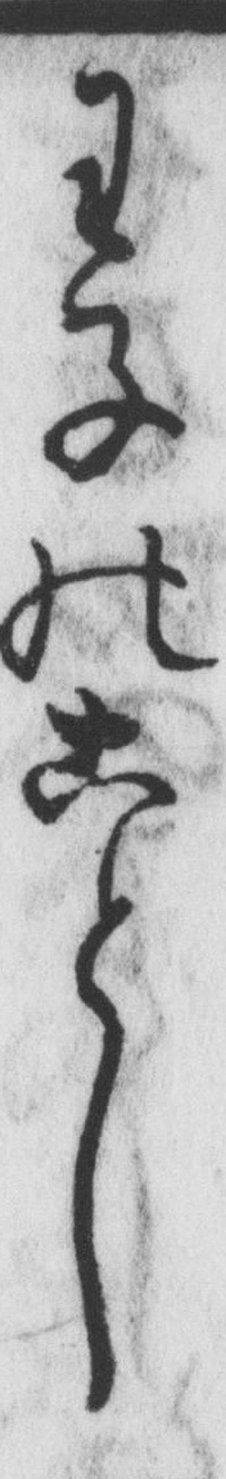わ子のことし
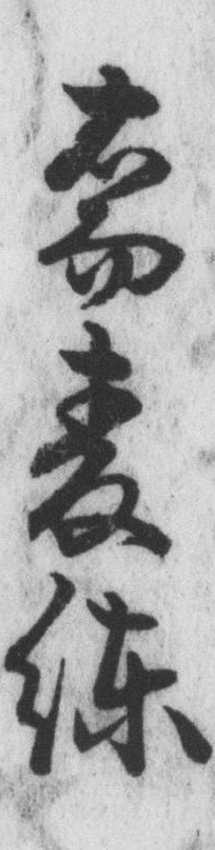蕎麦練
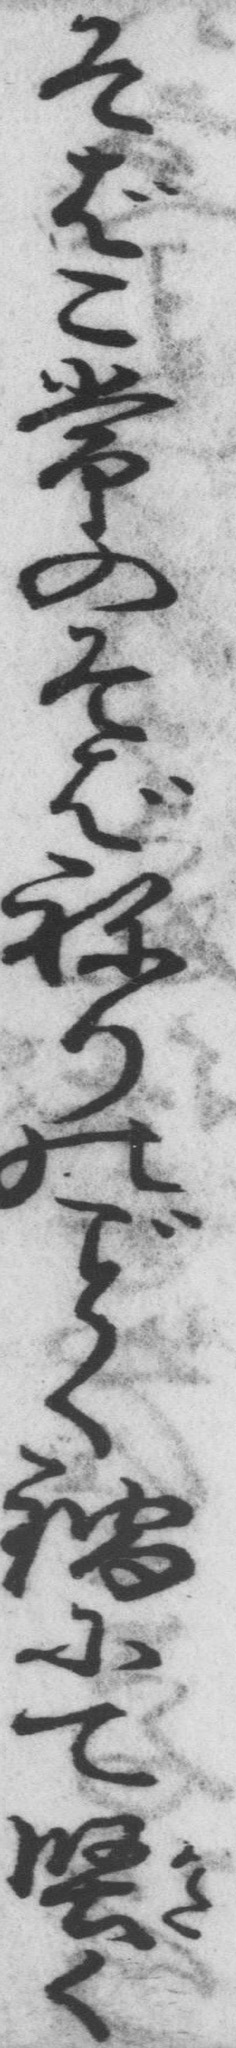そばこ常のそばねりのごとく鍋にて堅く
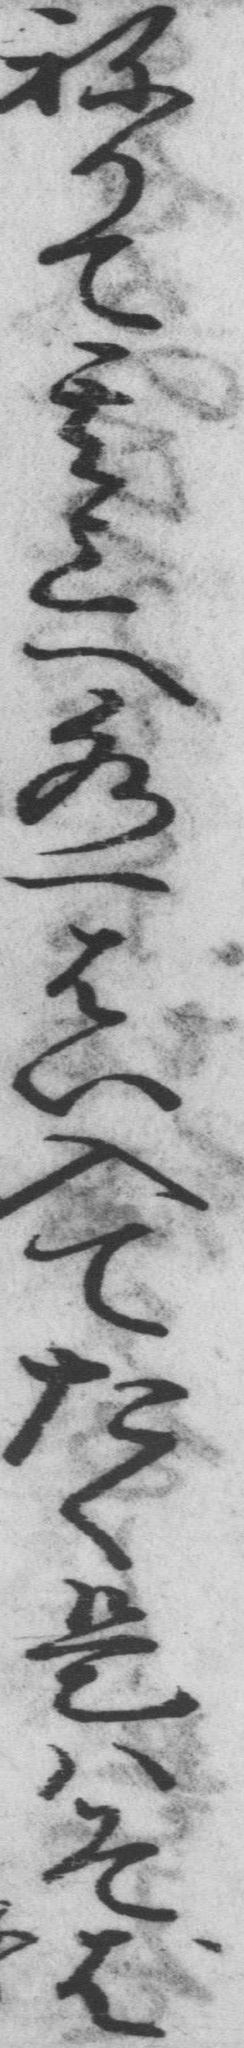ねりて其上へ水一はい入てたく是はそば
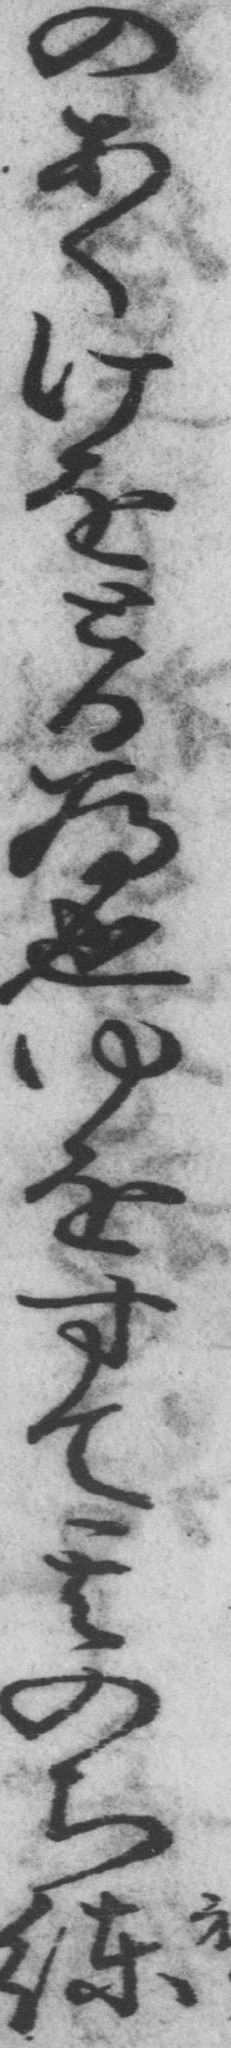のあくけをとる為也ゆをすて其のち練

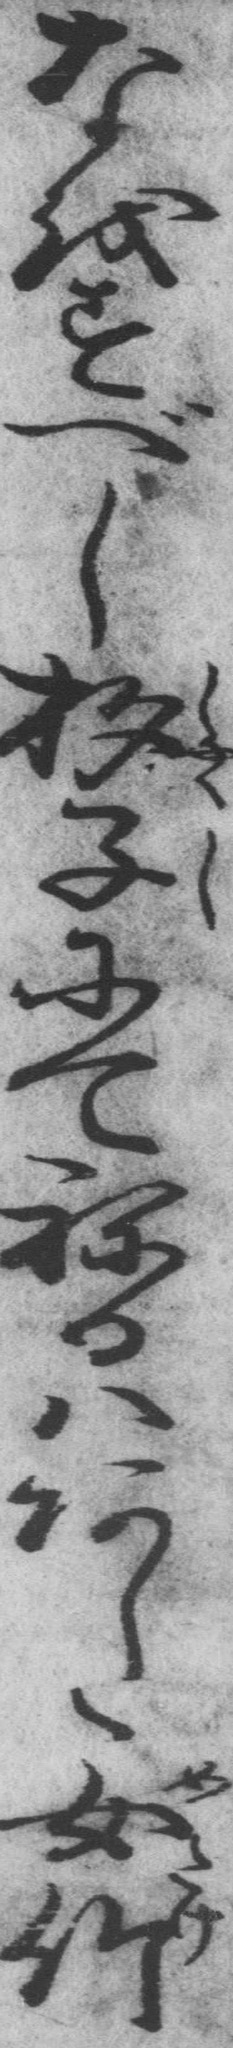なをすべし杓子にてねるはあしく女竹
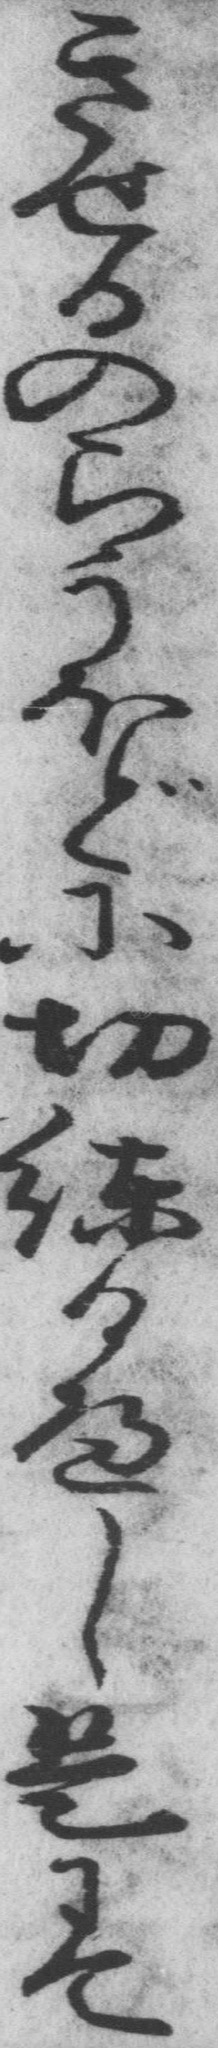きせるのらうほどに切練るへし是にて
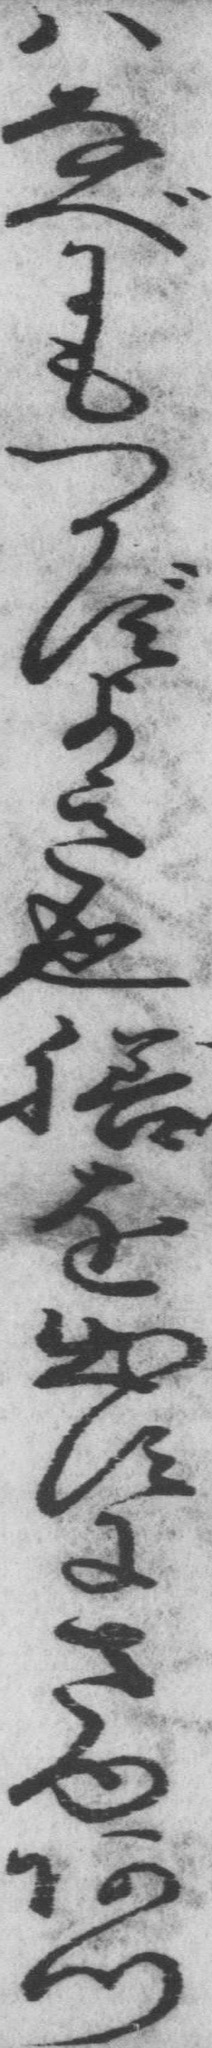はなべにもつかずよき也膳を出すにさゆあつ
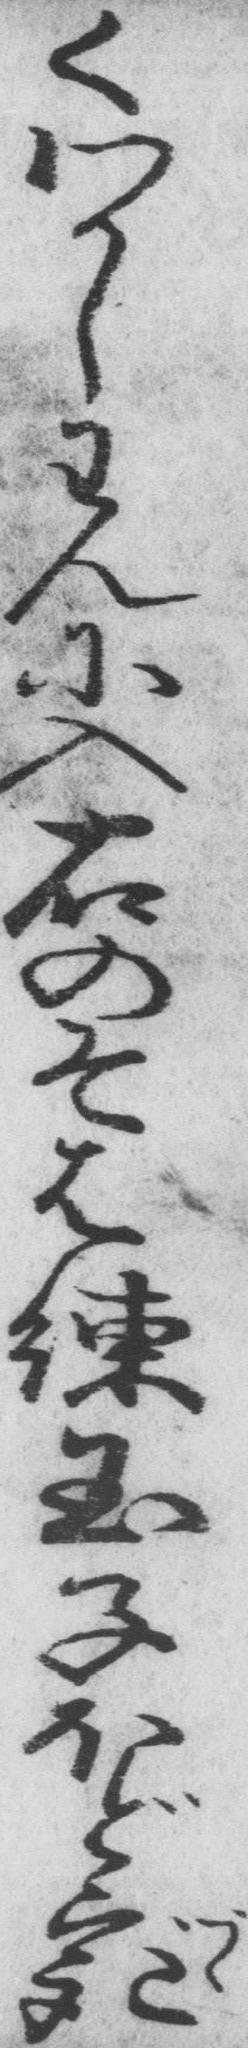くわかしわんに入右のそは練玉子ほど宛
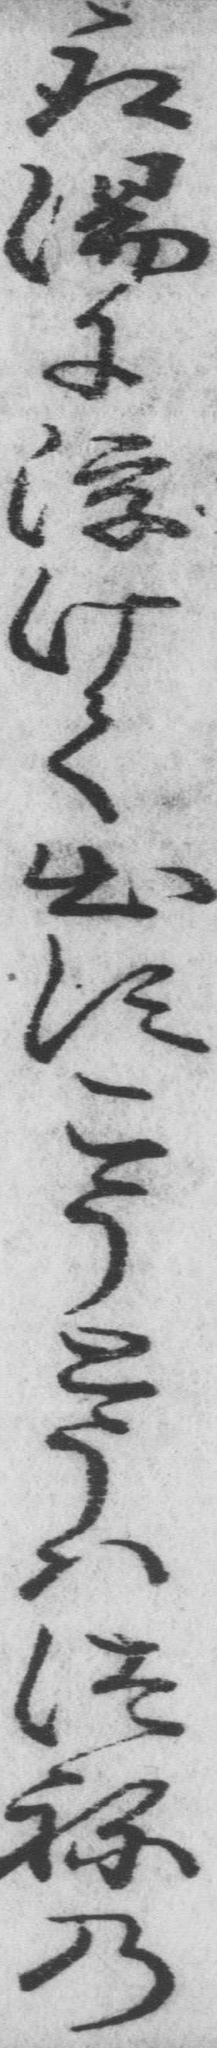取湯に浮けて出すこうとうはつねの
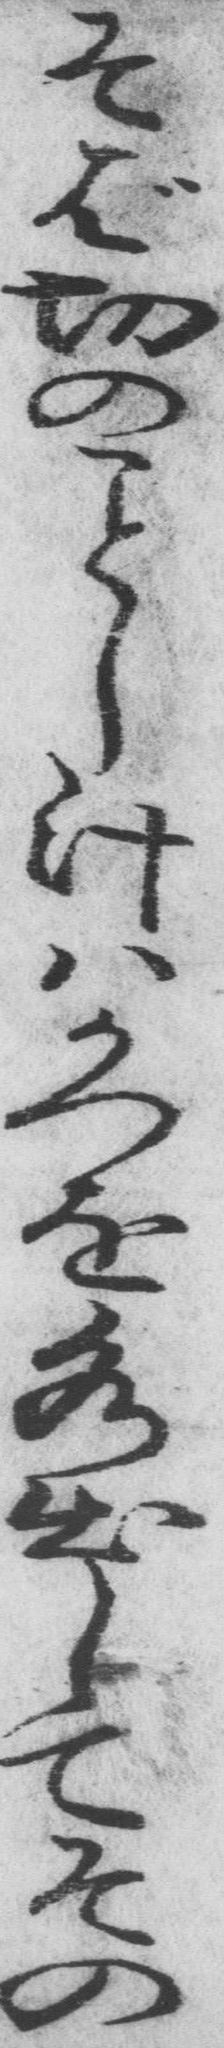そば切のことし汁はかつを水出してその
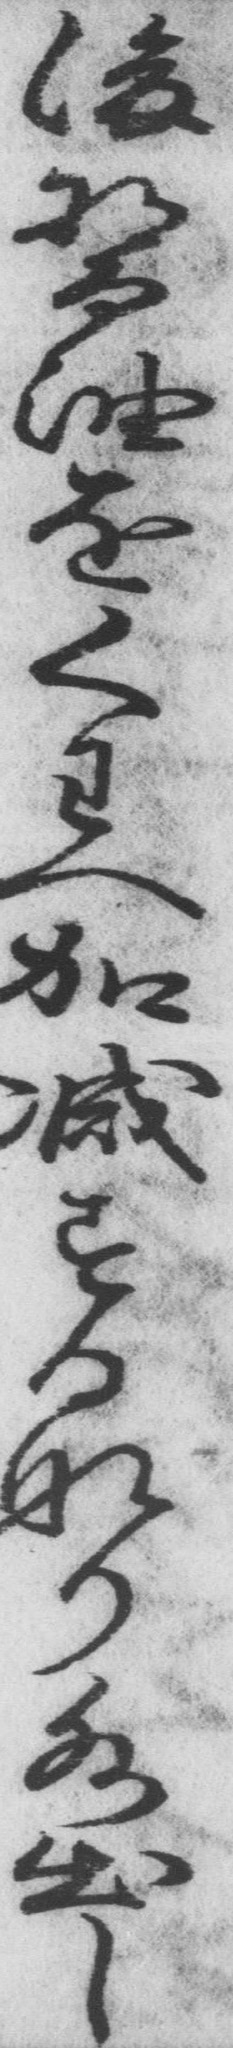後醤油をくわへ加減するなり水出し
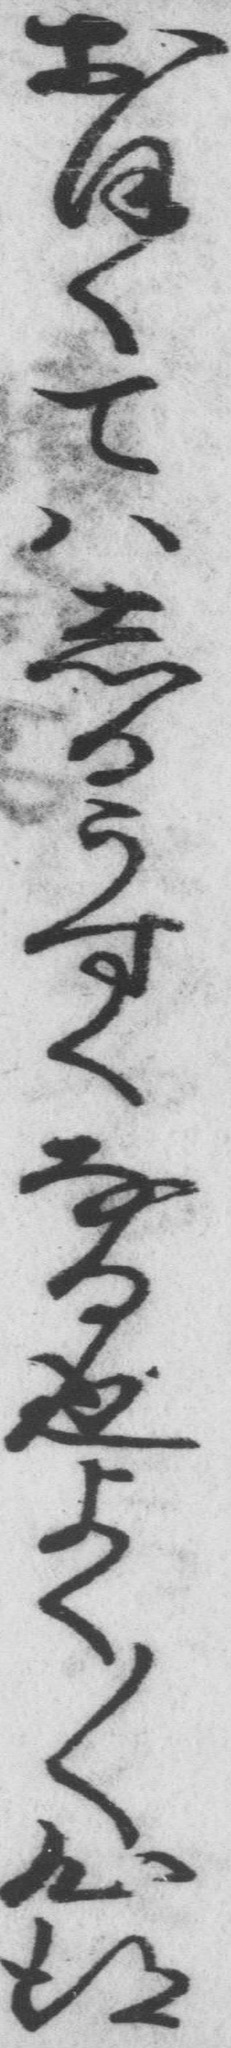おほくてはしるうすくなる也よく〳〵心得
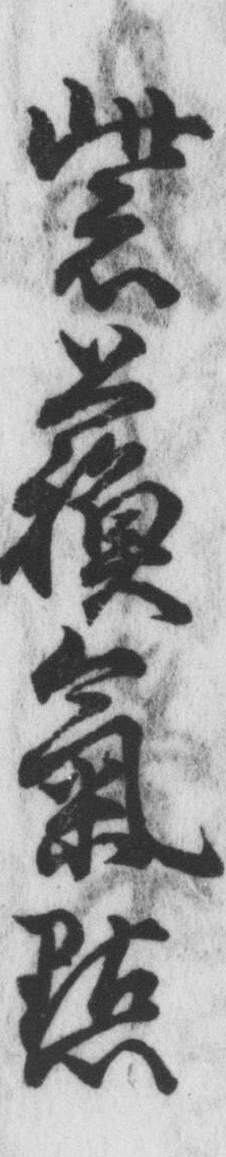紫蘇気点
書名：料理山海郷
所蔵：大阪府立大学学術情報センター 国文学研究資料館
